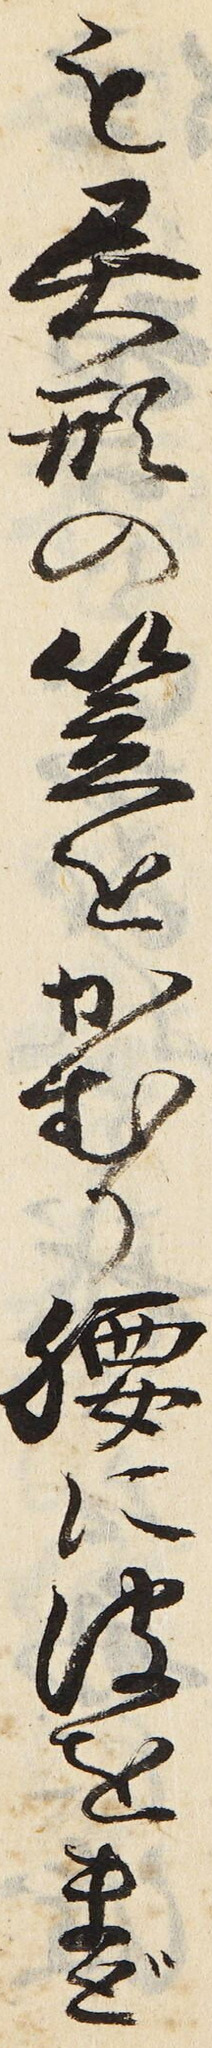も異形の笠をかむり腰に皮をまど
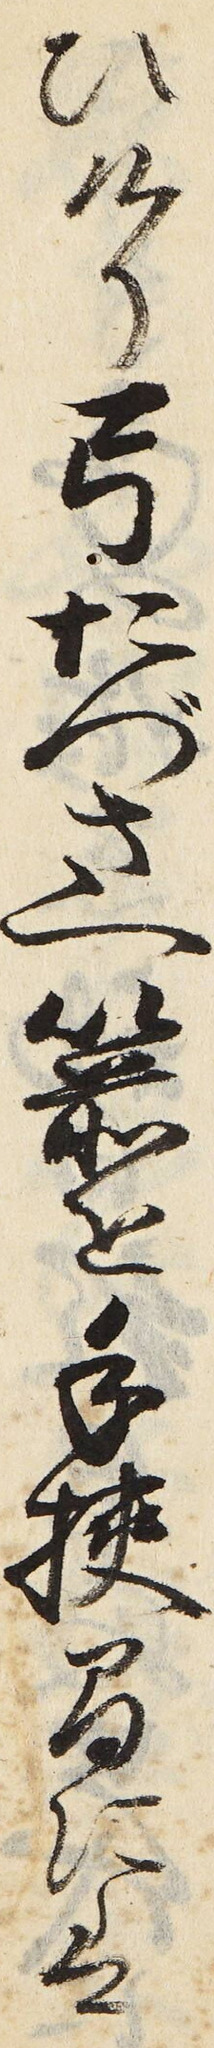ひけり弓たづさへ箭を手挟間には
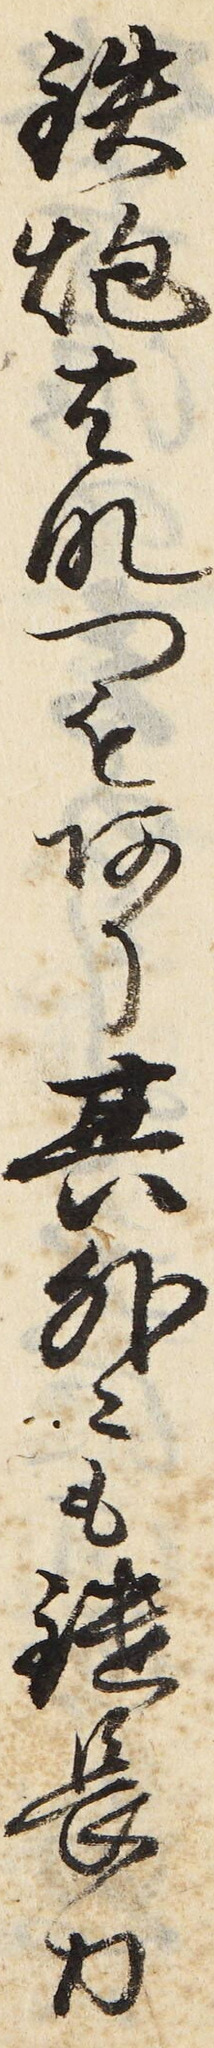鉄砲はなつもあり其外にも鑓長刀
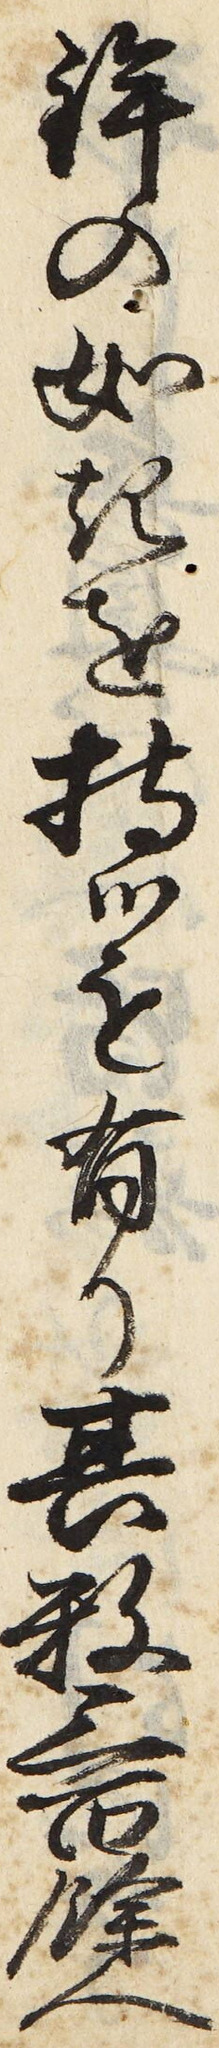鉾の如きを持つも有り其数三百余人
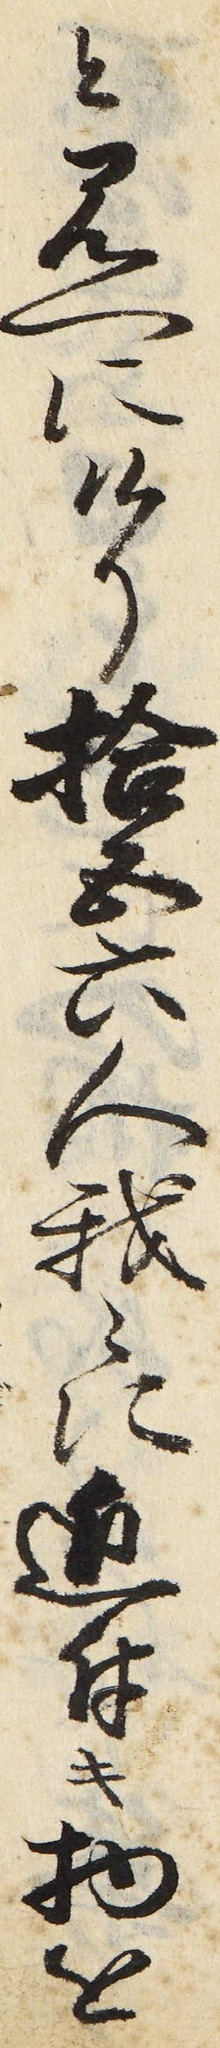と見へにけり拾五六人我々に追付き物を
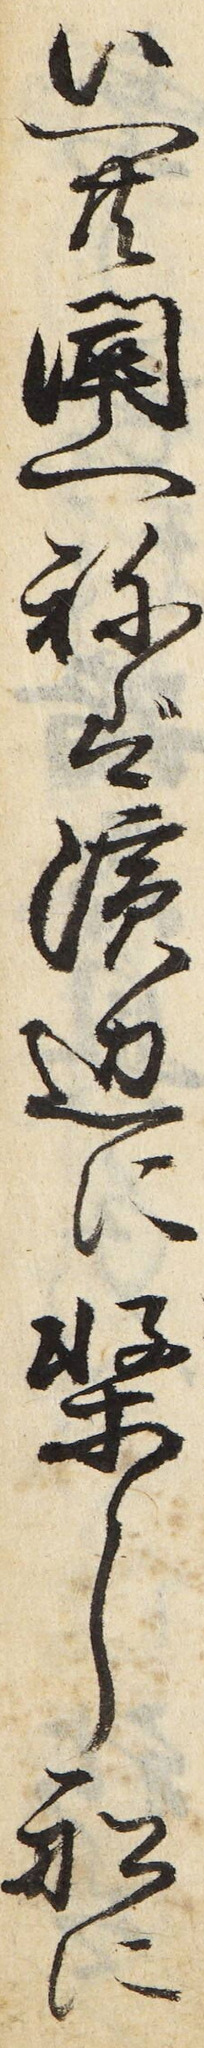いへ共聞へねば浜辺に繋し船に

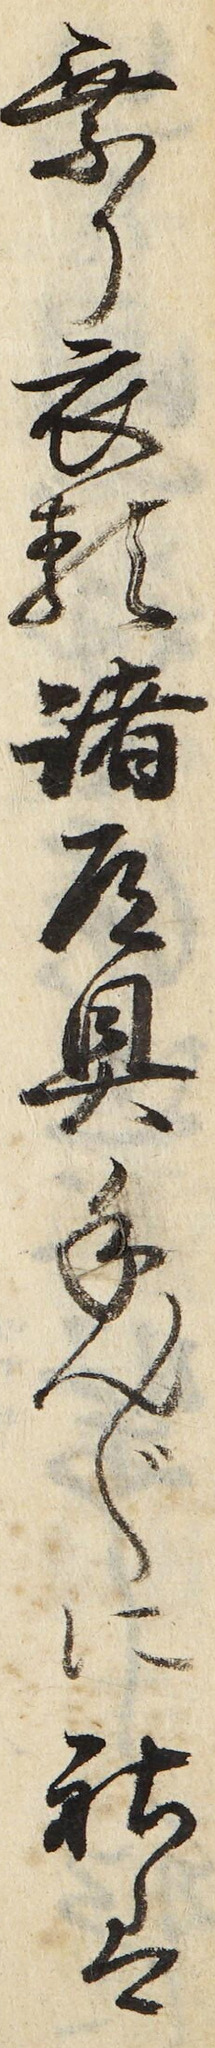乗り衣類諸道具手ん〴〵に船は
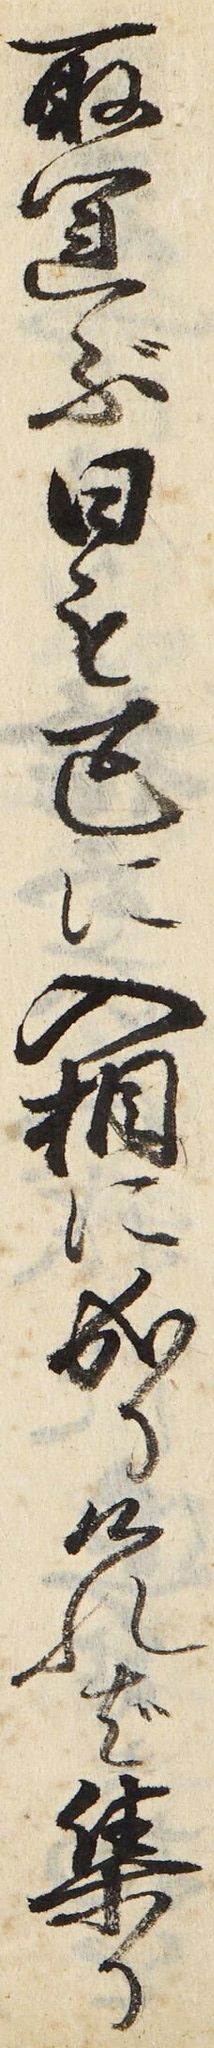取運ぶ日も已に入相に成りければ集り
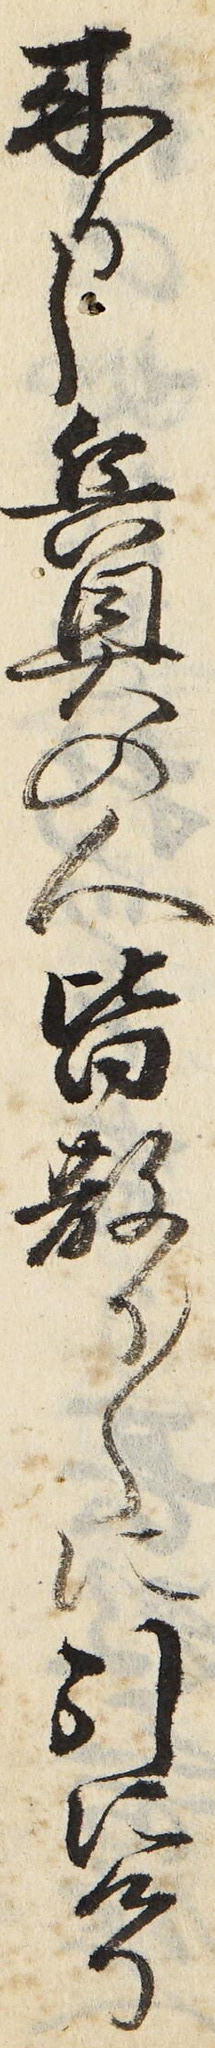来りし兵具の人皆散り〴〵に引にけり
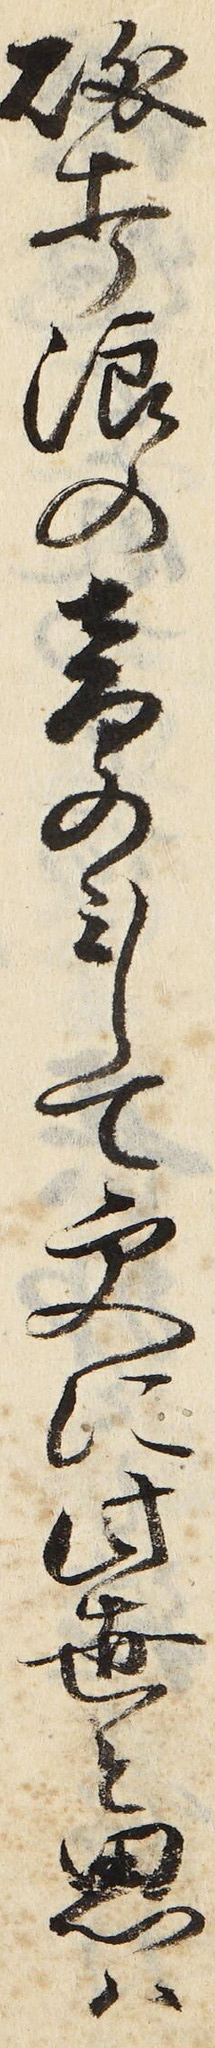磯打浪の音のみして更に此世と思は
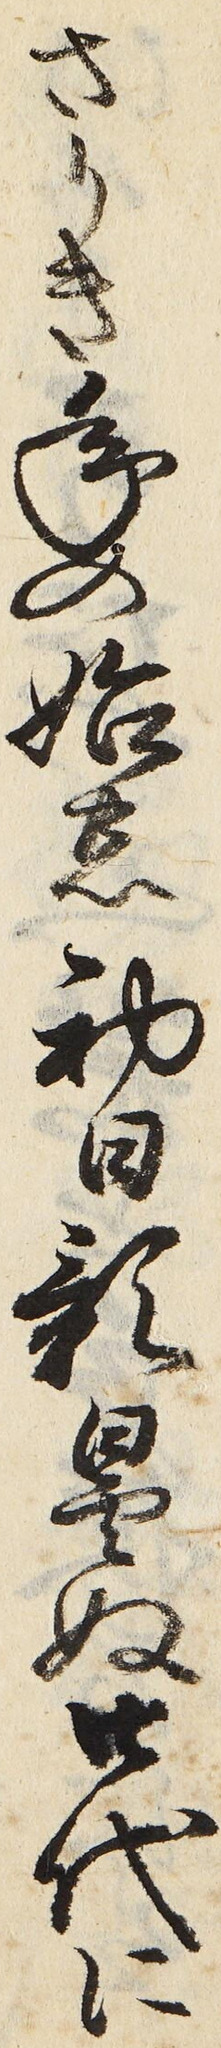さりき年の始の初日影曇ぬ御代に
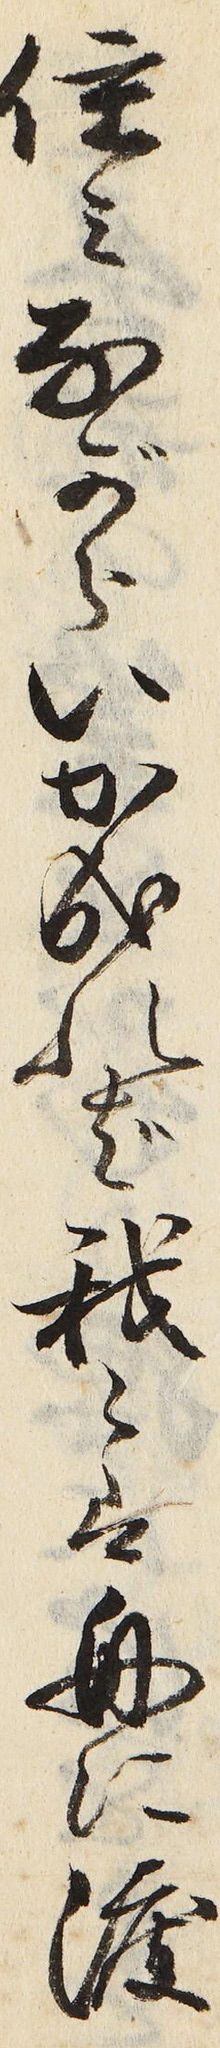住みながらいか成れば我々は舟に渡
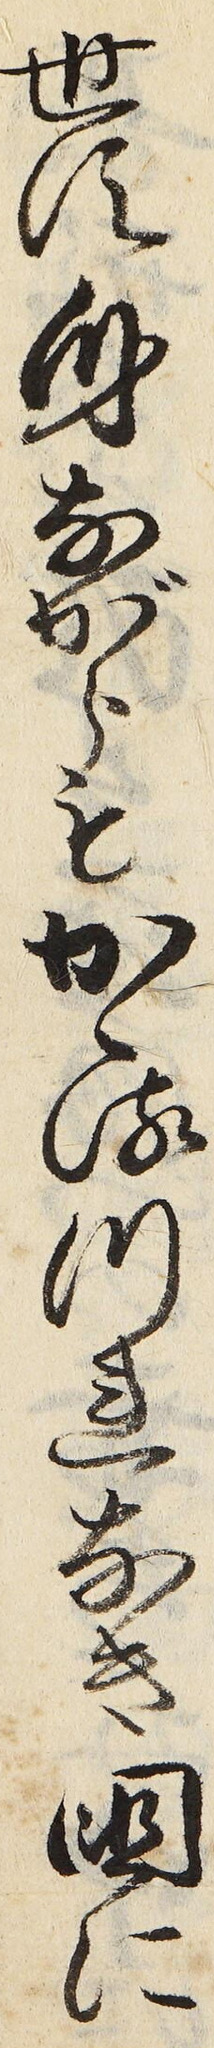世す身ながらもかゝるつれなき国に
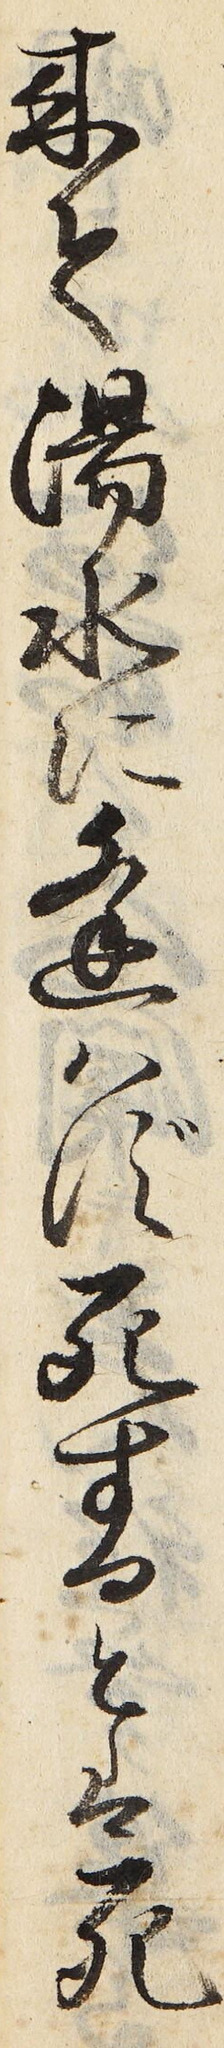来て湯水に逢はず死するとは死
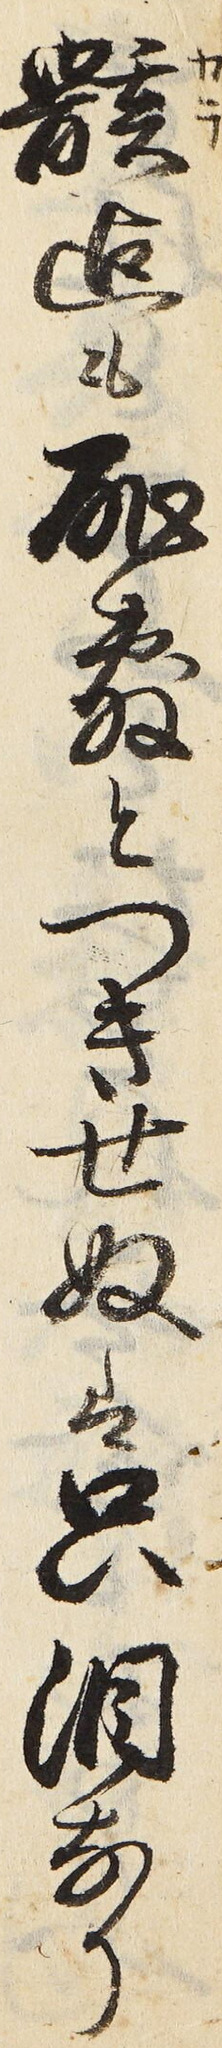骸迠も取敷とつきせぬは只泪なり
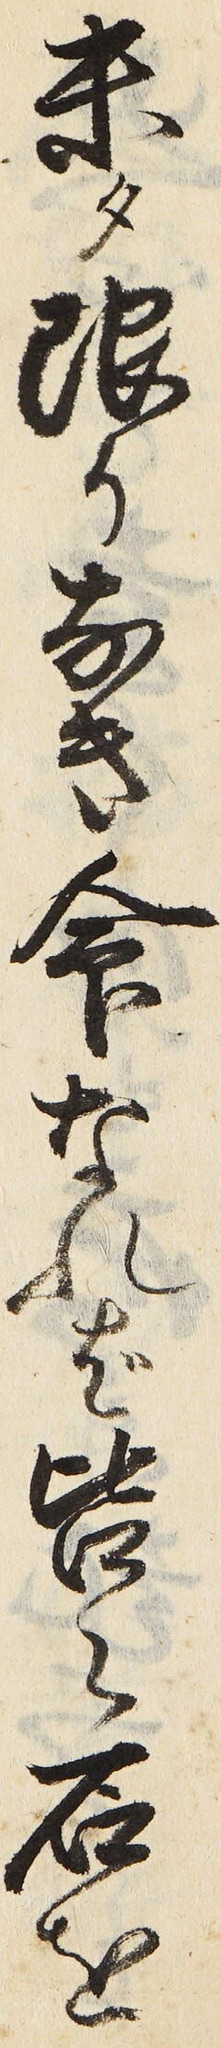未た限りなき命なれば皆々石を
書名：華夷九年録
